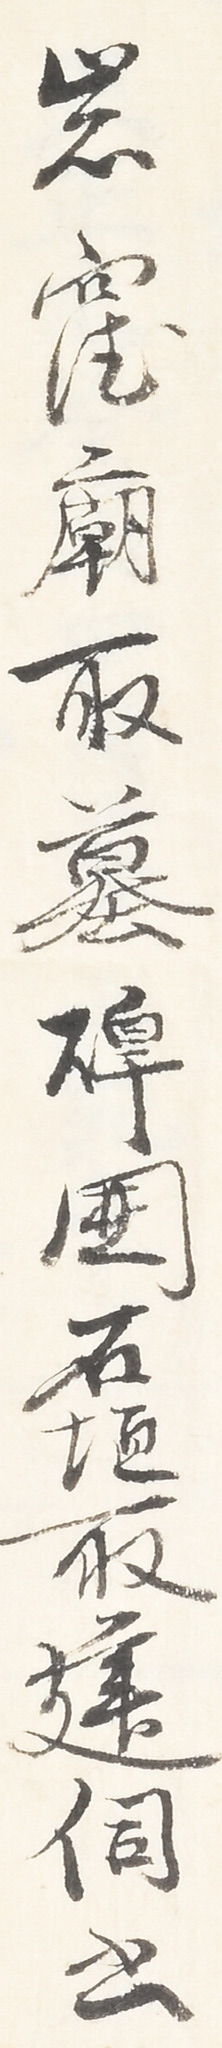岩窪廟取墓碑囲石垣取建伺書

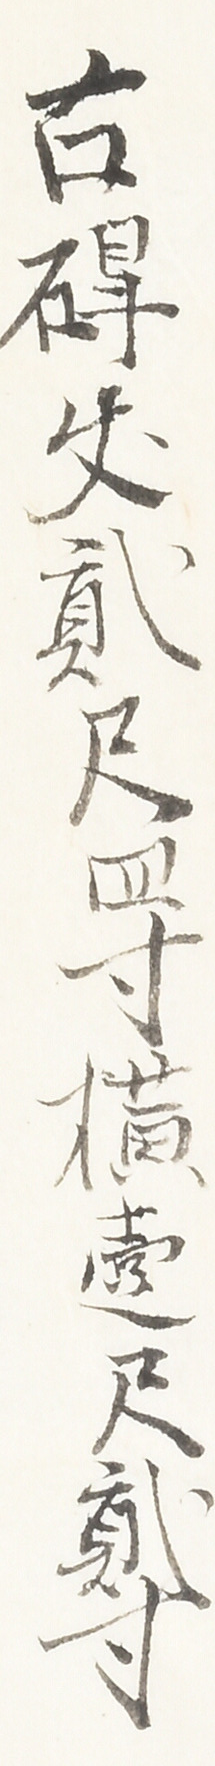古碑丈弐尺四寸横壱尺弐寸
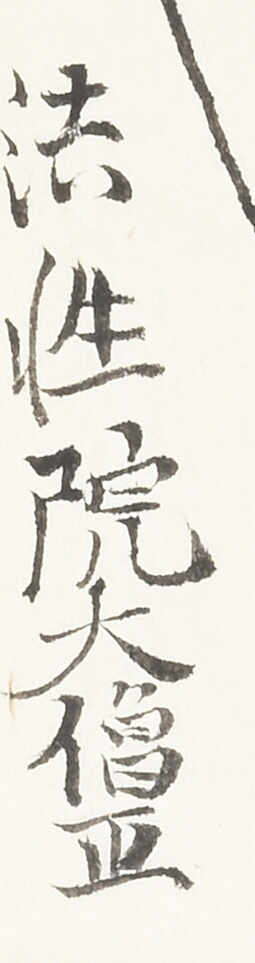法性院大僧正
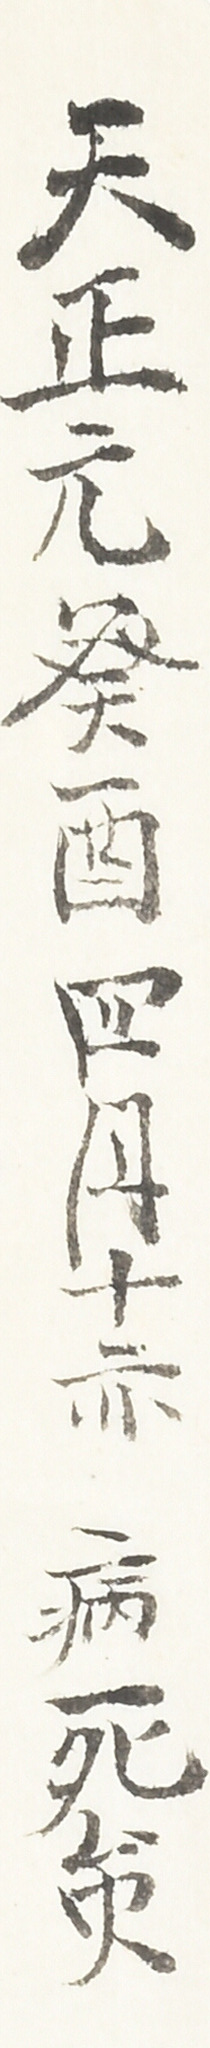天正元癸酉四月十二日病死矣
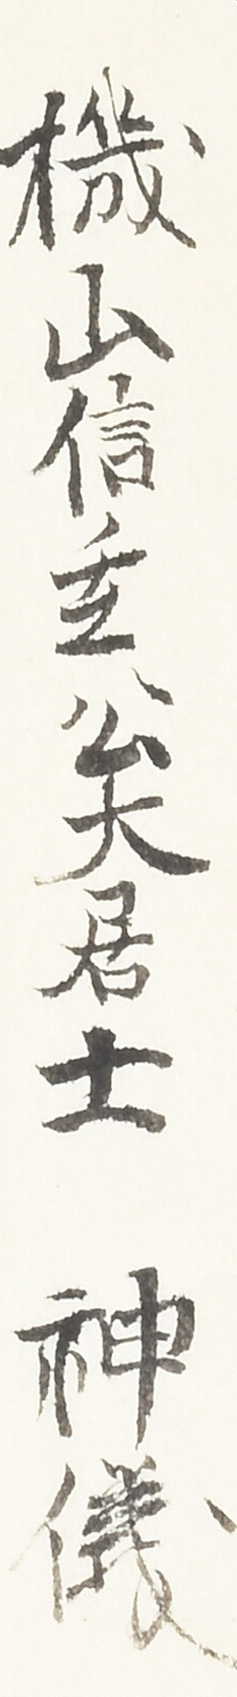機山信玄公大居士神儀
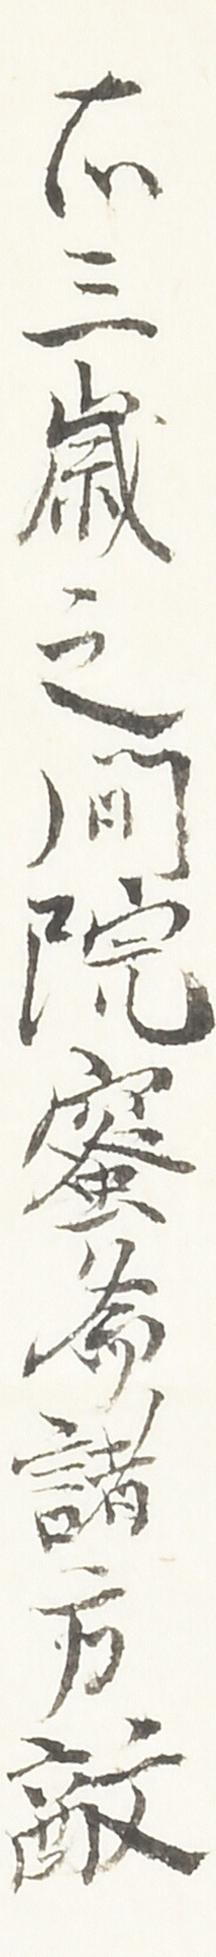右三歳之間院蜜為詣方敵
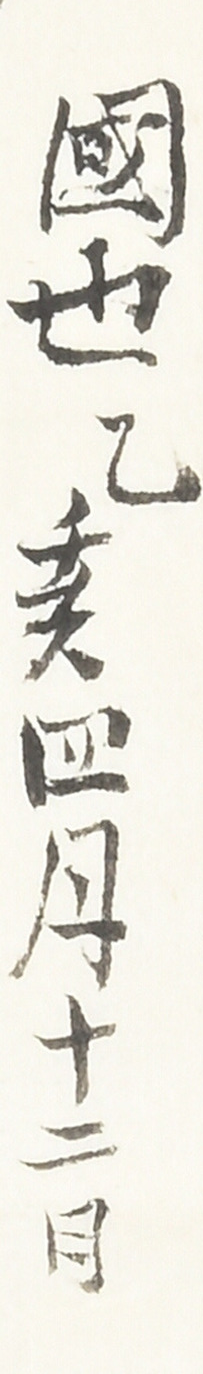国也乙亥四月十二日
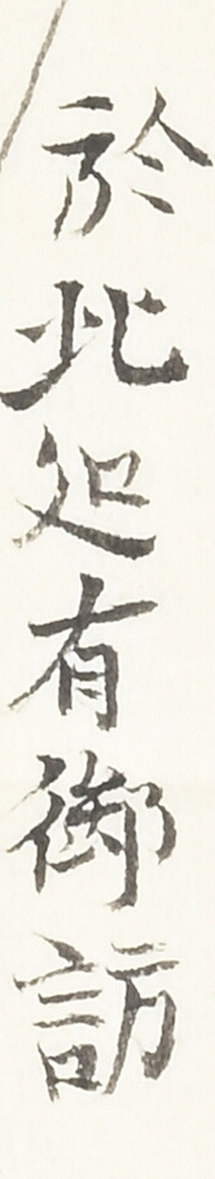於此処有御訪

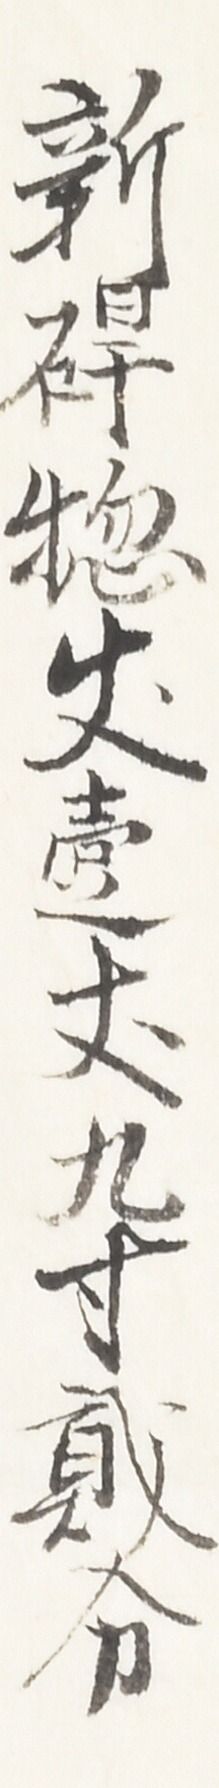新碑惣丈壱丈九寸弐分
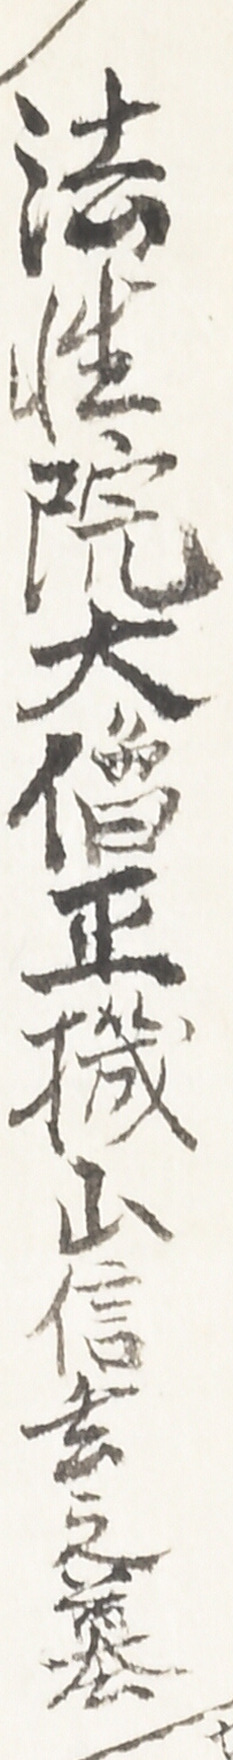法性院大僧正機山信玄之墓
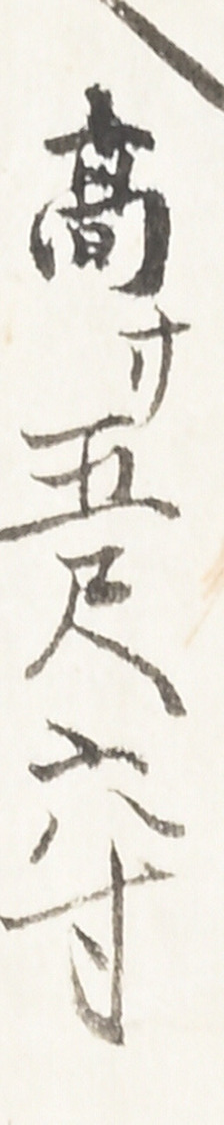高サ五尺六寸
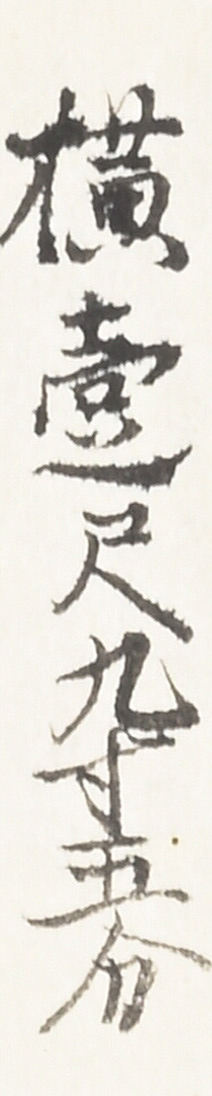横壱尺九寸五分
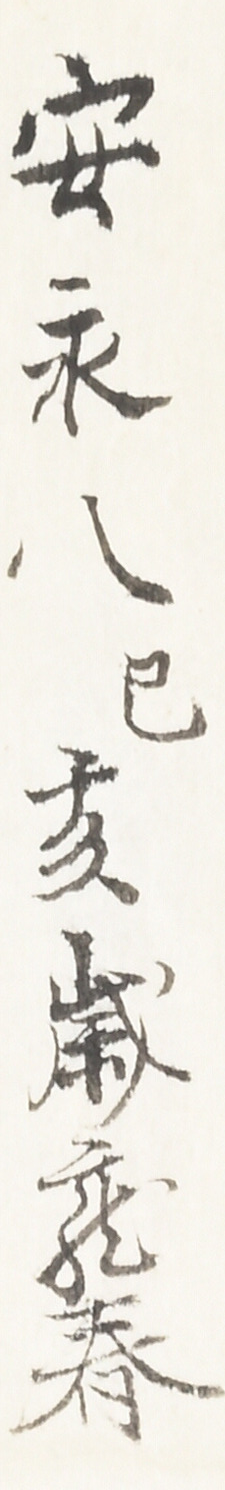安永八己亥歳春
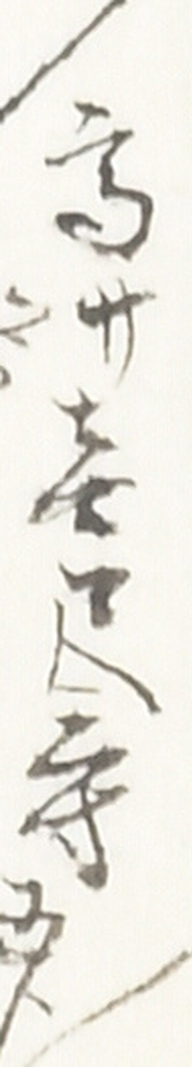高サ壱尺弐寸五分
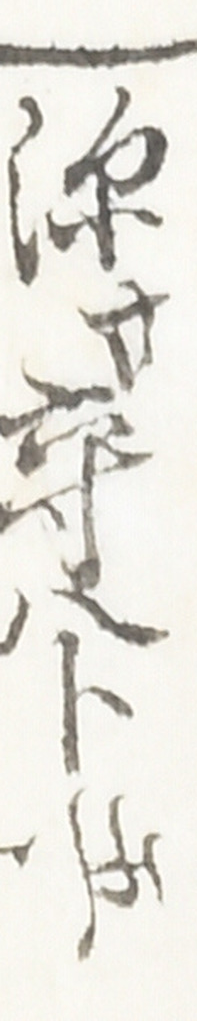深サ六寸八分

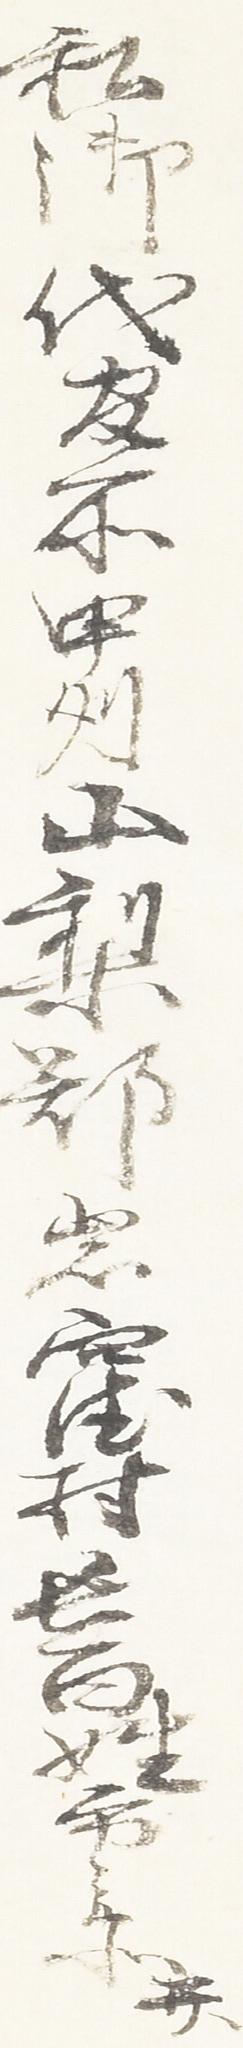私御代官所甲州山梨郡岩窪村長百姓市兵衛并
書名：岩窪廟取（所）墓碑囲石垣取建伺書
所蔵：伊那市立高遠町図書館・合同会社AMANE
